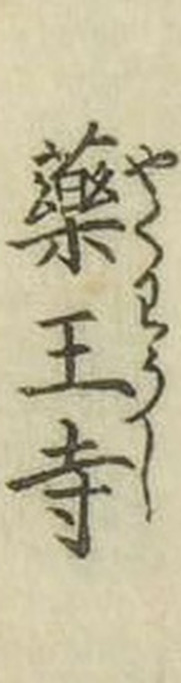薬王寺
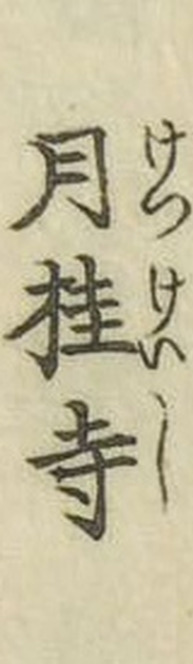月桂寺

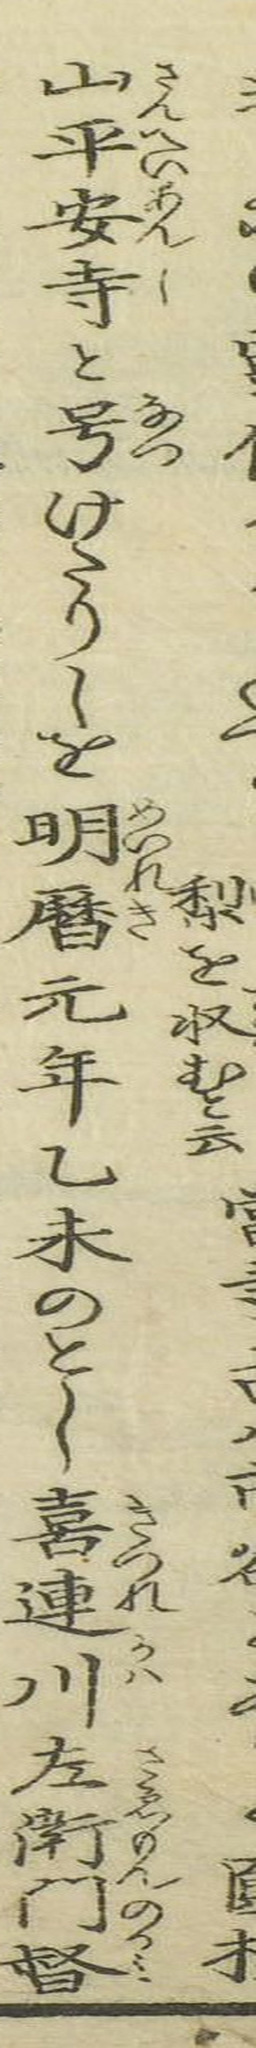山平安寺と号けたりしを明暦元年乙未のとし喜連川左衛門督
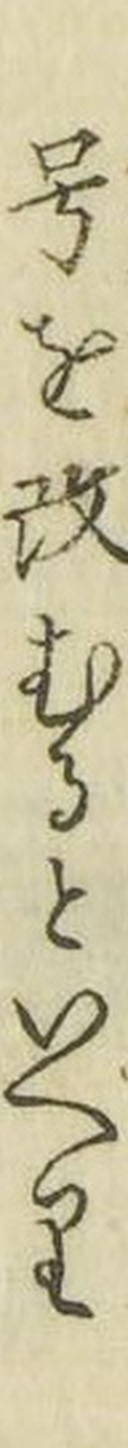号を改むるといへり
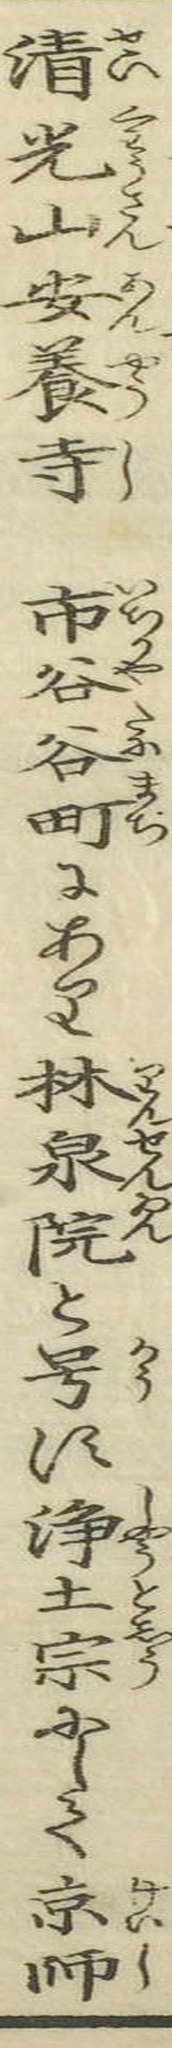清光山安養寺市谷谷町にあり林泉院と号す浄土宗にして京師
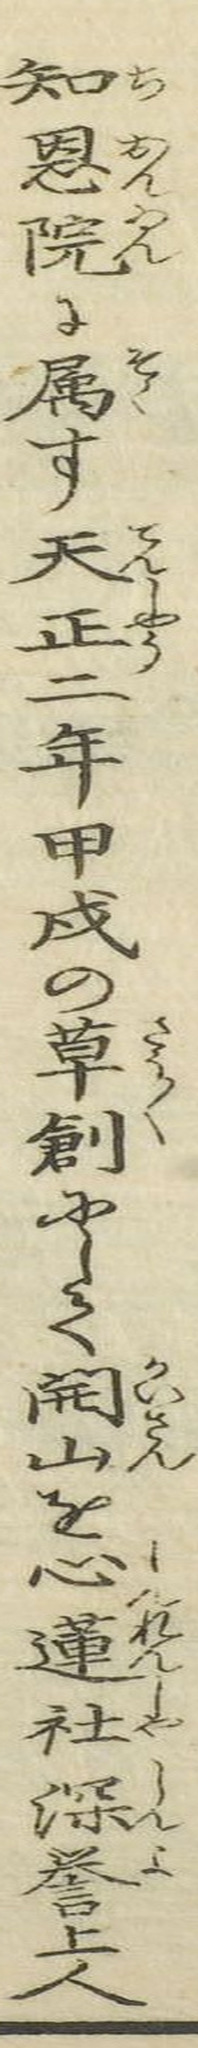知恩院に属す天正二年甲戌の草創にして開山を心蓮社深誉上人
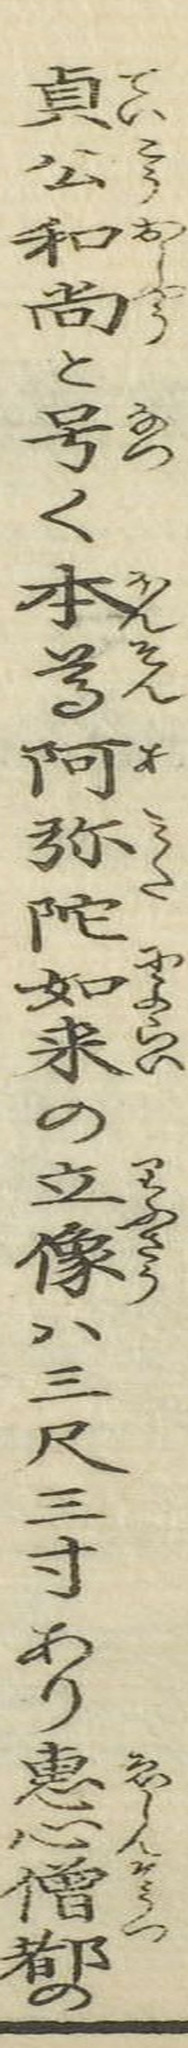貞公和尚と号く本尊阿弥陀如来の立像は三尺三寸あり恵心僧都の
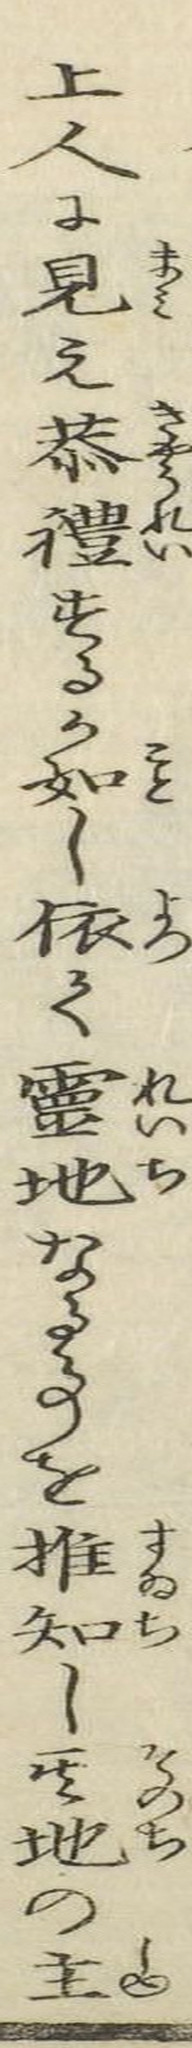上人に見え恭礼するか如し依て霊地なる事を推知し其地の主
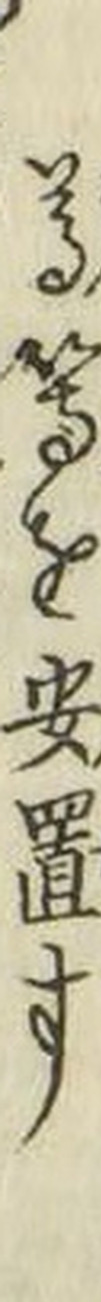尊等を安置す
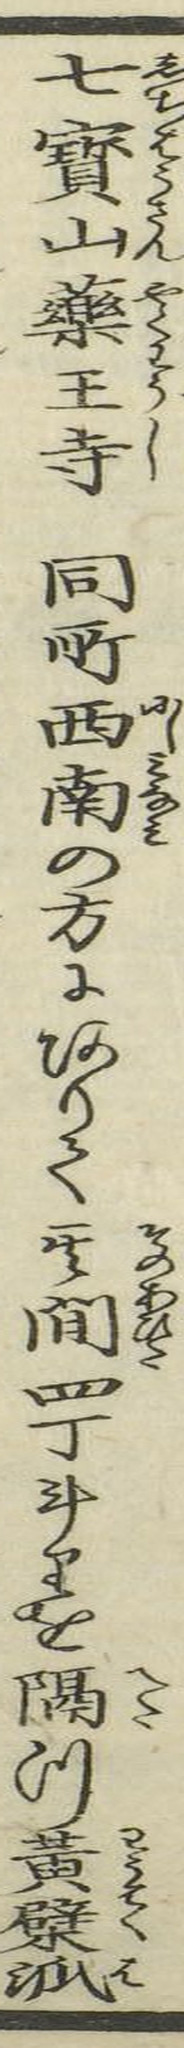七宝山薬王寺同所西南の方にありて其間四丁計りを隔つ黄檗派
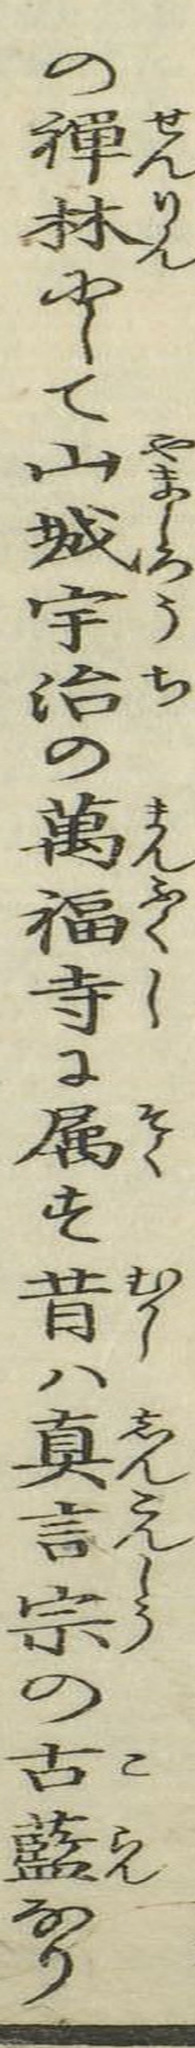の禅林にして山城宇治の萬福寺に属す昔は真言宗の古藍なり
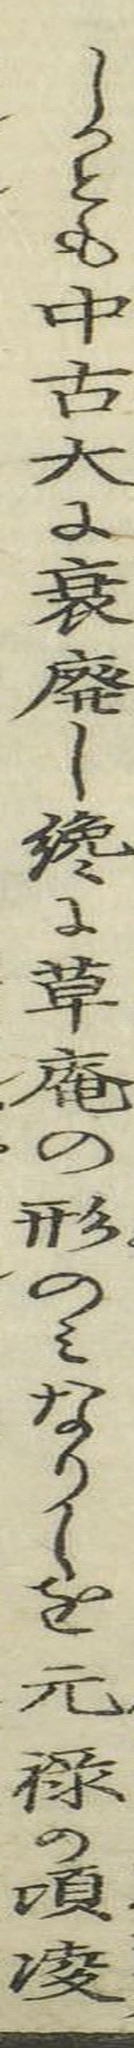しかとも中古大に衰廃し纔に草庵の形のみなりしを元禄の頃凌

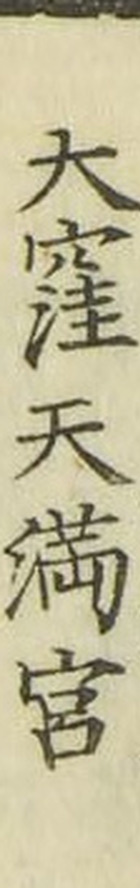大窪天満宮
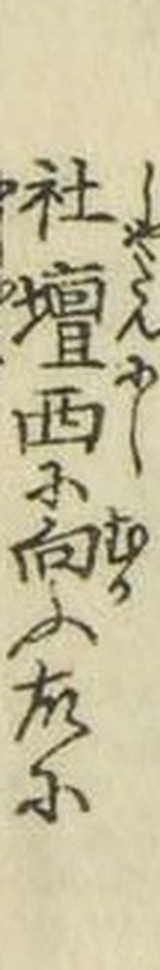社壇西に向ふ故に
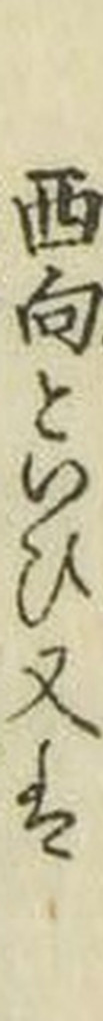西向といひ又は
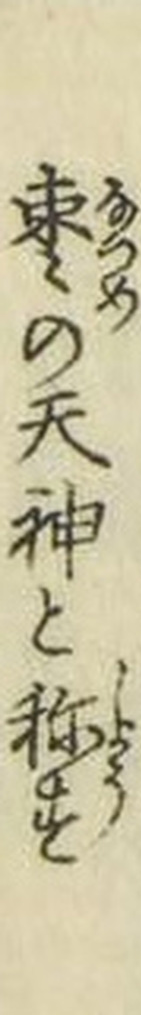棗の天神と称す
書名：江戸名所図会 20巻 巻之11
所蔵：東京学芸大学教育コンテンツアーカイブ
